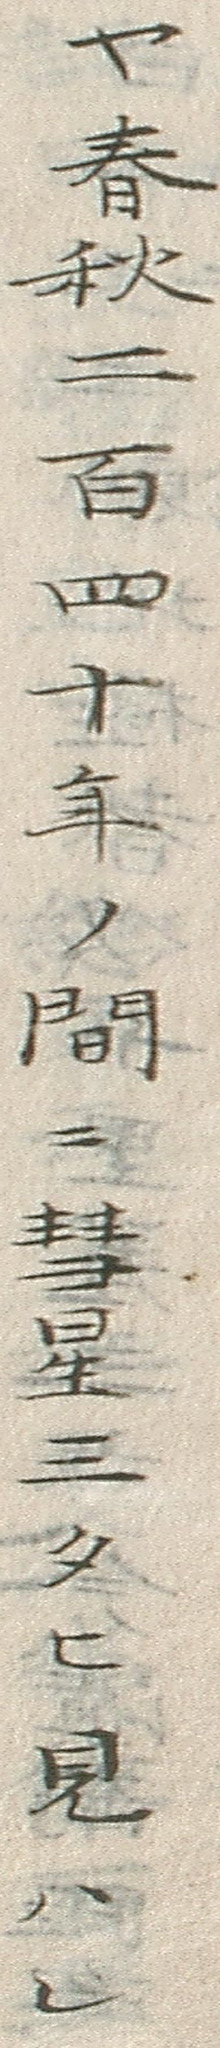ヤ春秋二百四十年ノ間ニ彗星三タヒ見ハレ
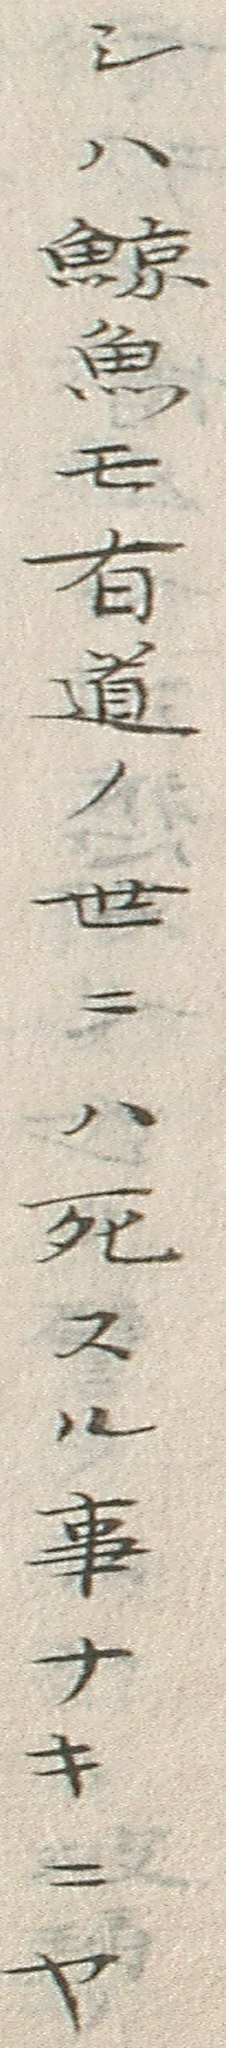シハ鯨魚モ有道ノ世ニハ死スル事ナキニヤ
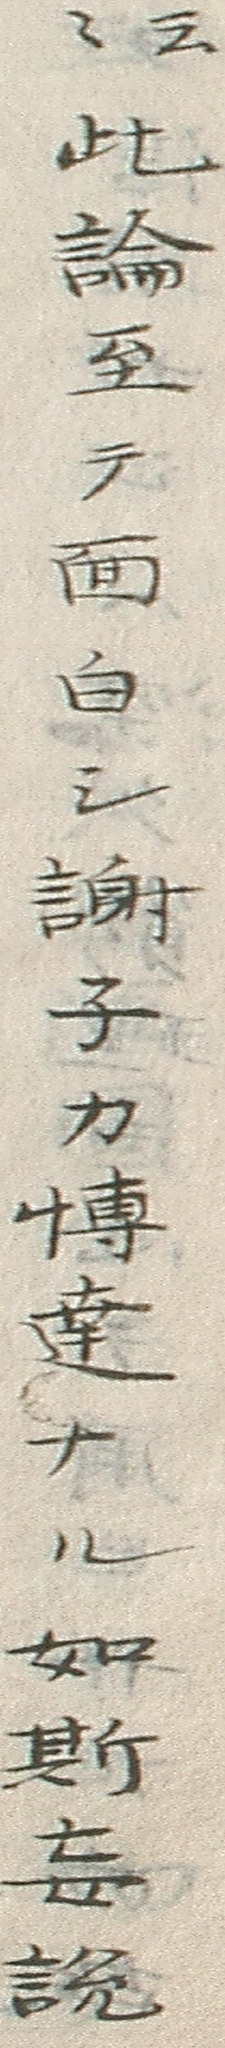云〻此論至テ面白シ謝子カ博達ナル如斯妄説

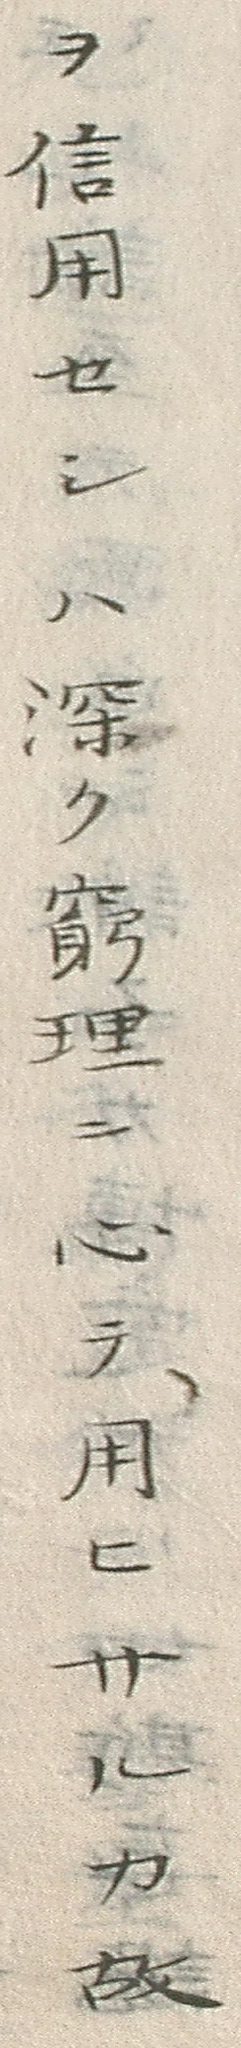ヲ信用セシハ深ク窮理ニ心ヲ用ヒサルカ故
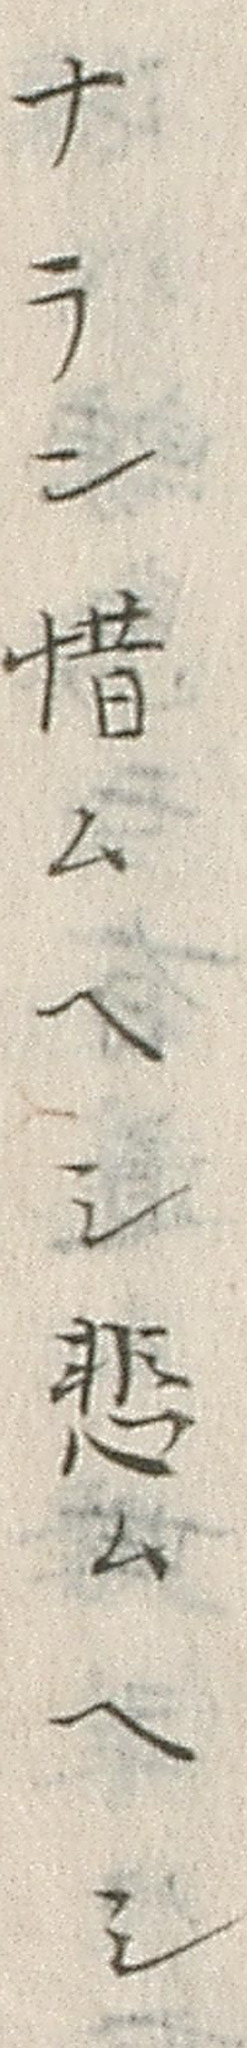ナラン惜ムヘシ悲ムヘシ
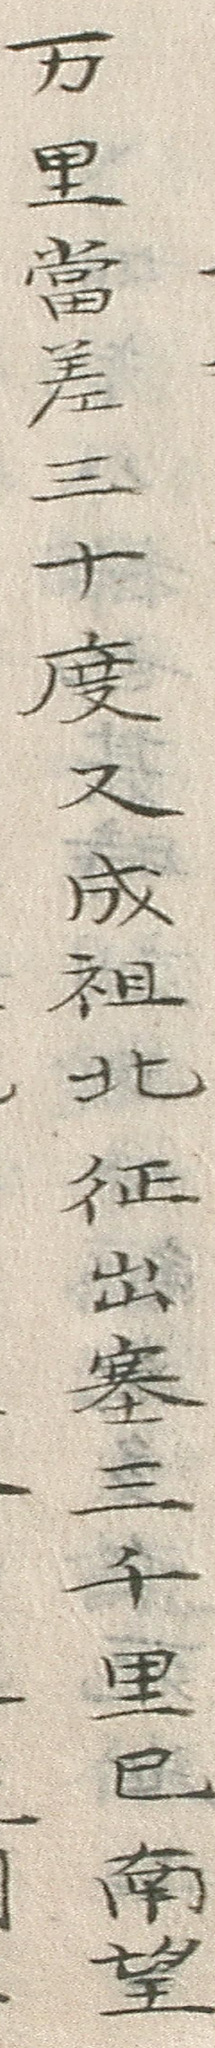万里当差三十度又成祖北征出塞三千里巳南望
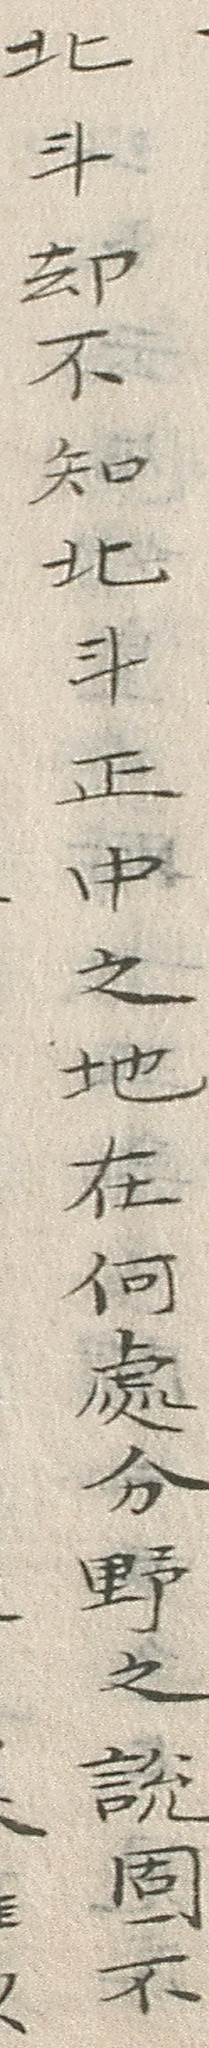北斗却不知北斗正中之地在何処分野之説固不
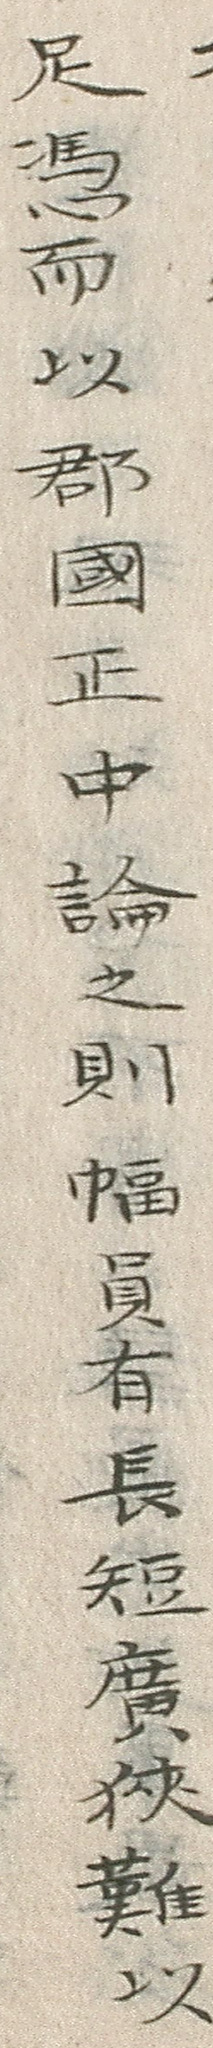足憑而以郡国正中論之則幅員有長短広狭難以
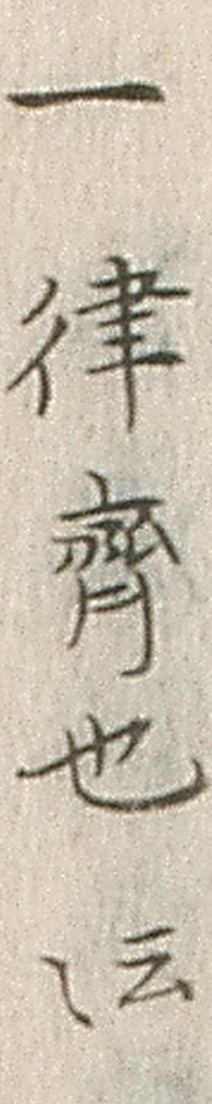一律齋也云〻
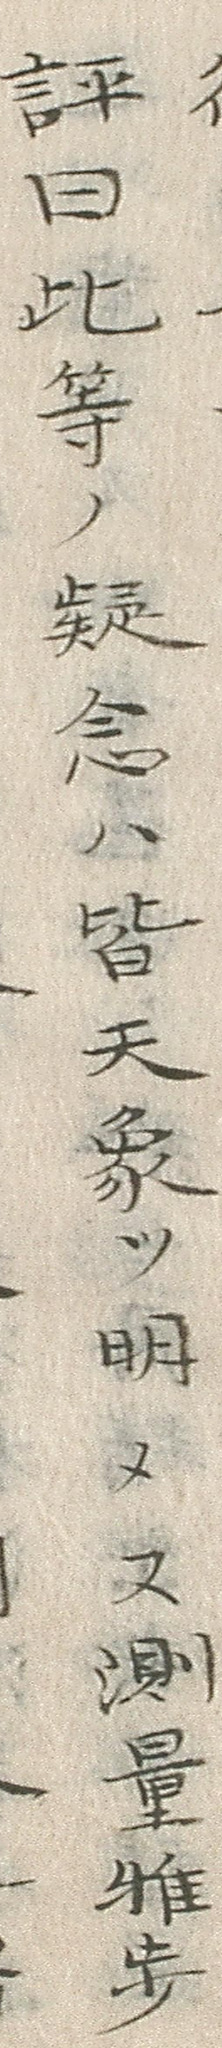評曰此等ノ疑念ハ皆天象ッ明メス測量推歩
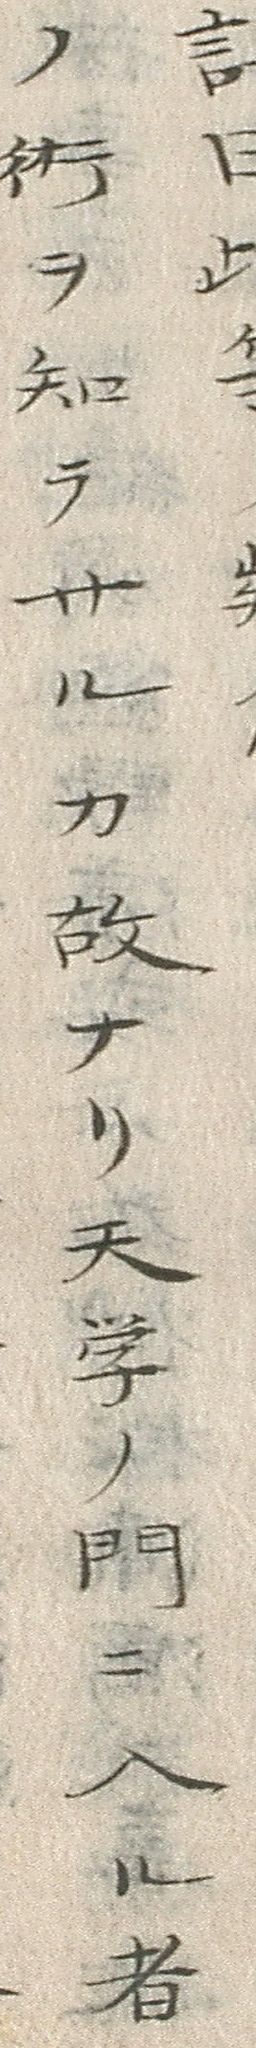ノ術ヲ知ラサルカ故ナリ天学ノ門ニ入ル者
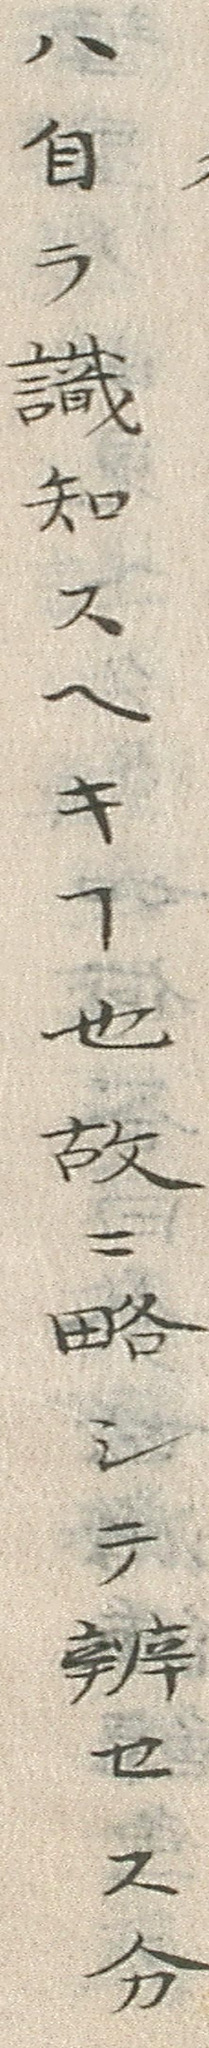ハ自ラ識知スヘキコト也故ニ略シテ弁セス分
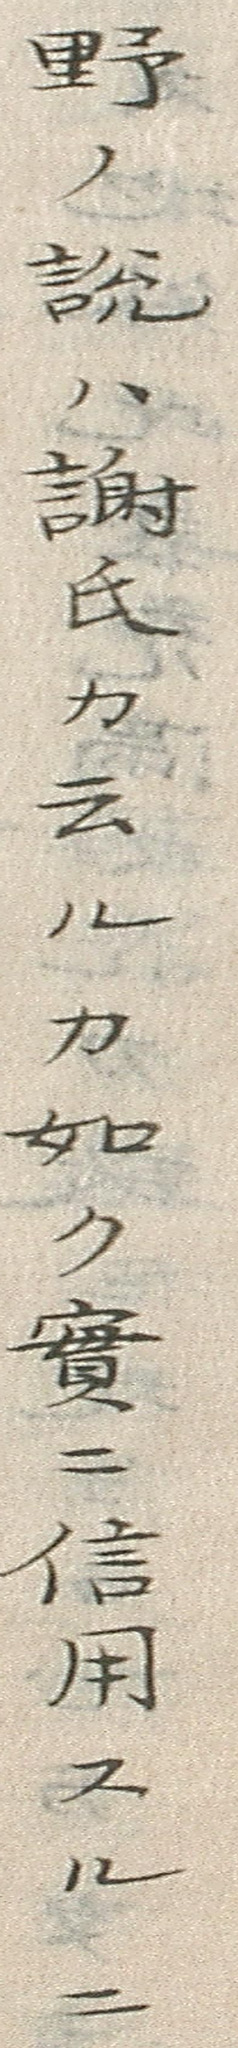野ノ説ハ謝氏カ云ルカ如ク実ニ信用スルニ
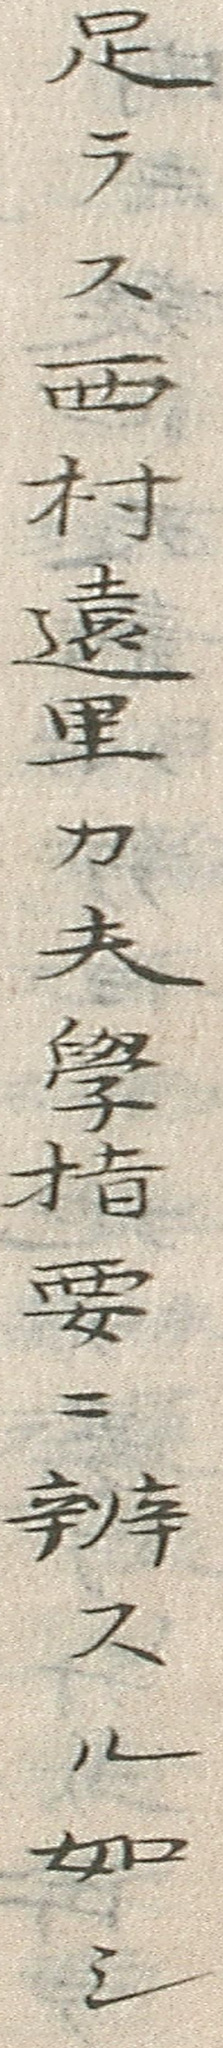足ラス西村遠里カ夫学指要ニ弁スル如シ
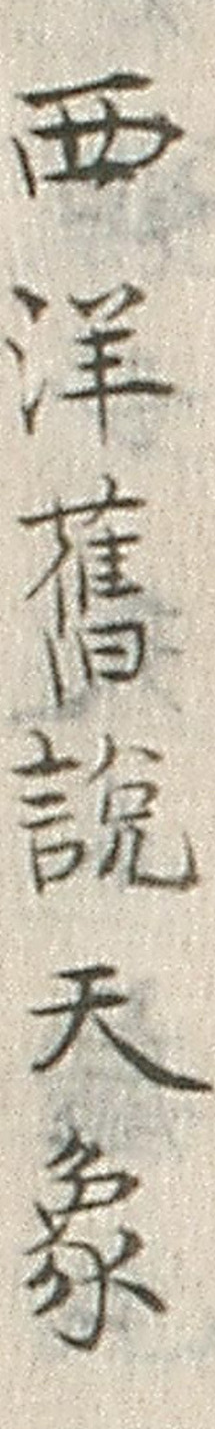西洋旧説天象
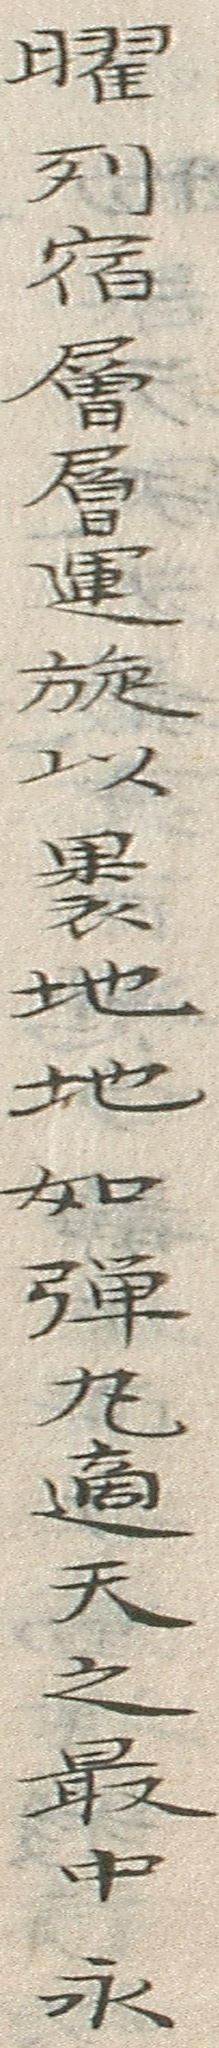曜列宿層層運旋以褁地地如弾丸適天之最中永
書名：天學略名目羽翼　全
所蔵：東京大学地震研究所図書室 Earthquake Research Institute Library, The University of Tokyo, JAPAN
